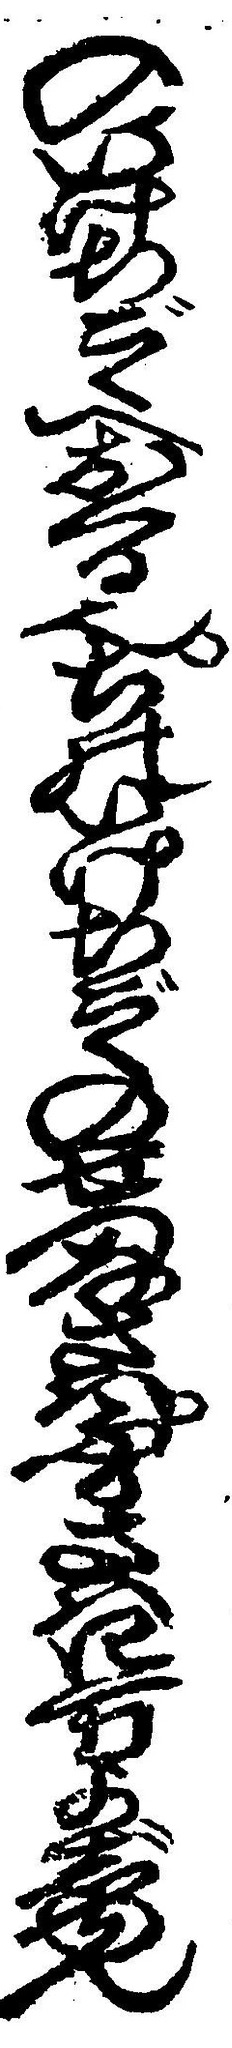のいけちごくへおくる也。ちのいけちごくのせつなさは四万よじゆん
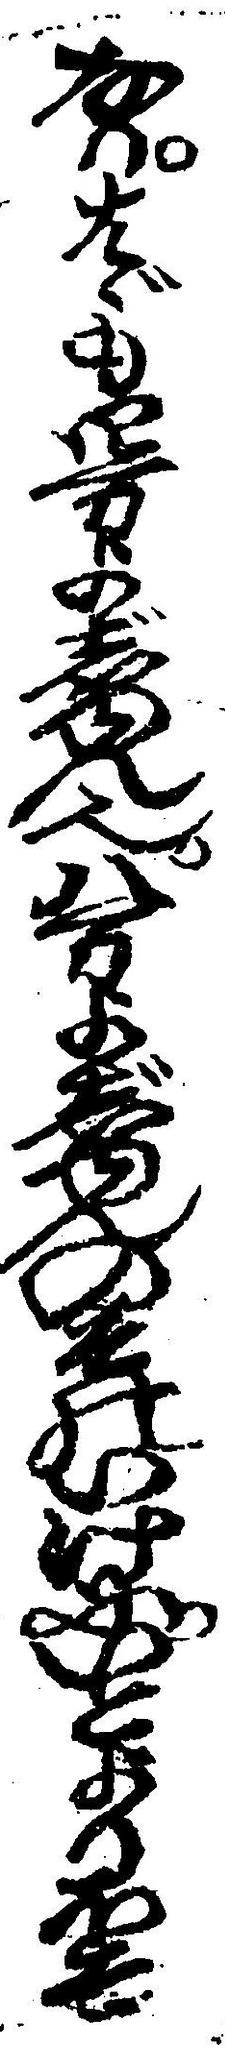なり。はゞも四万よじゆん也。八万よじゆんのそのいけに。いとよりほそ
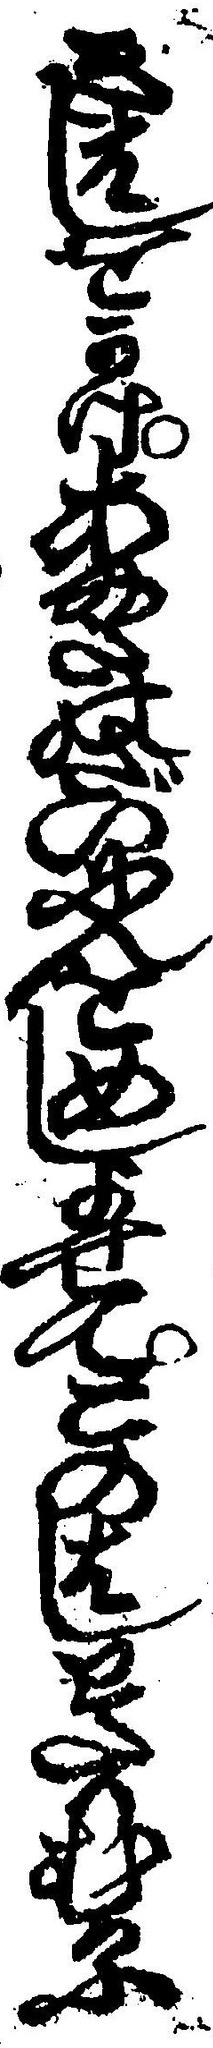きはしをかけ。あまたのざいにんをめしよせて。このはしわたりむかふ
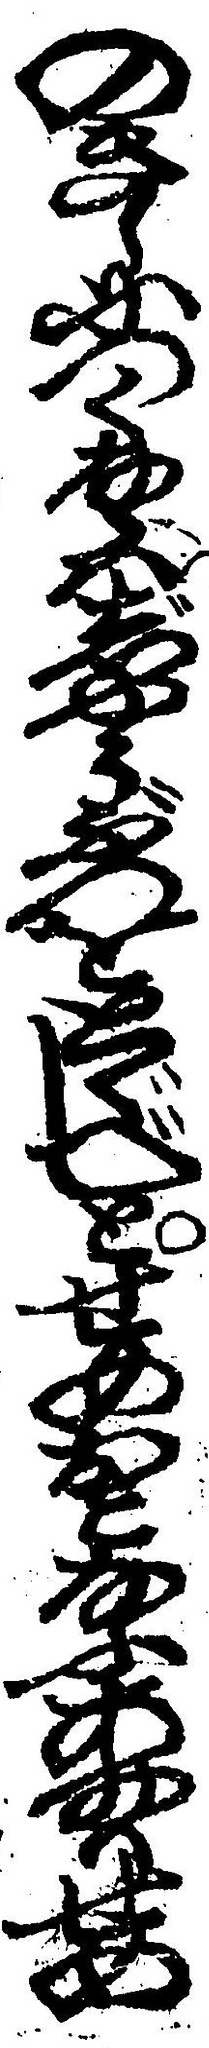のきしにつくならば。じやうぶつをとぐべしと。せめおこなふあまりせめ
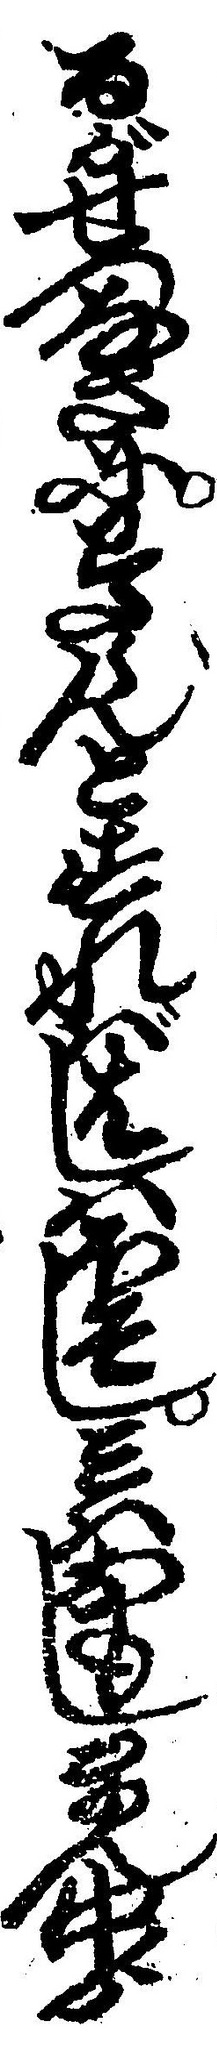るがせつなさに。わたらんとすればはしはほそし。みはおもしまん中ゟ
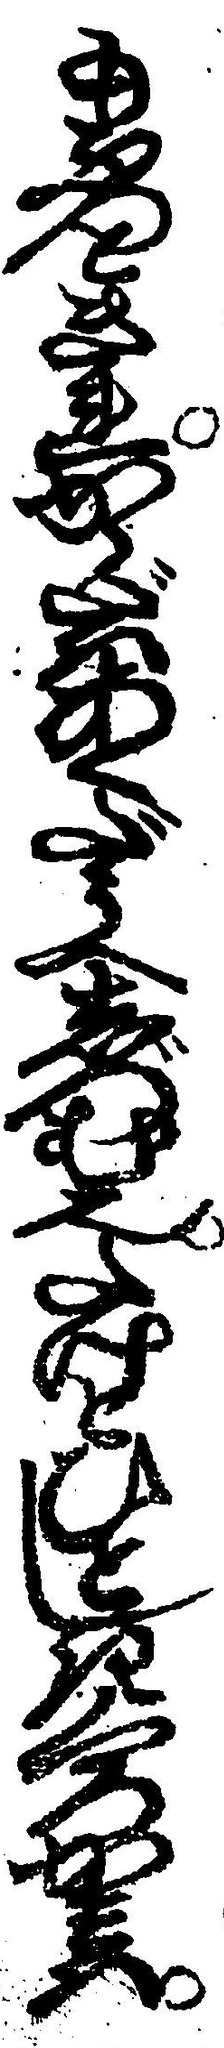もふつときれ。からだはあくだうへしづむ也。たけとひとしきくろかみは。
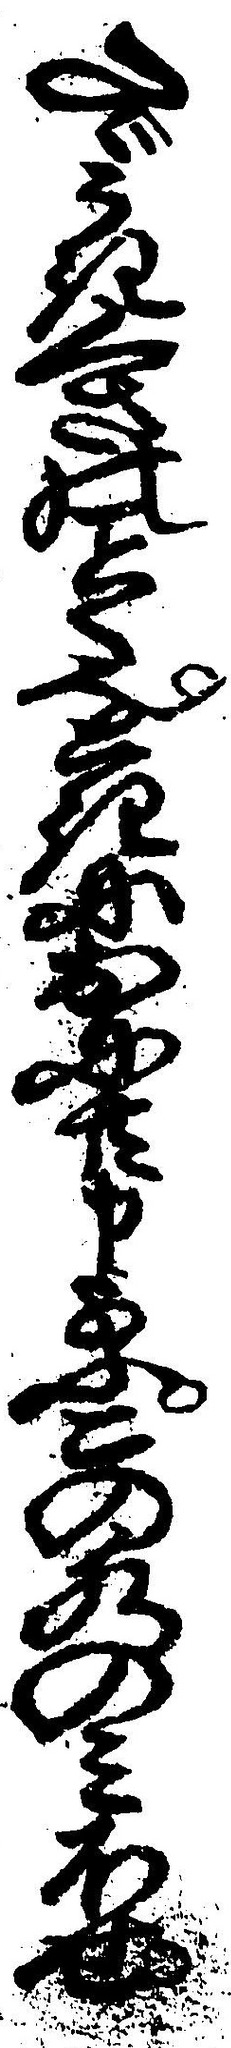たゞうきくさのことく也。ときにおに共申よふ。この水のみほせ。

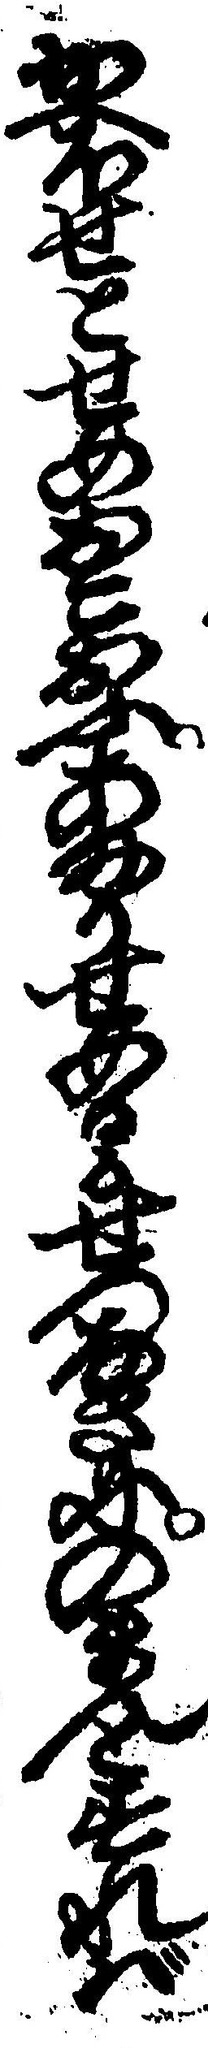かへほせとせめおこのふ。あまりせめるかせつなさに。のまんとすれば
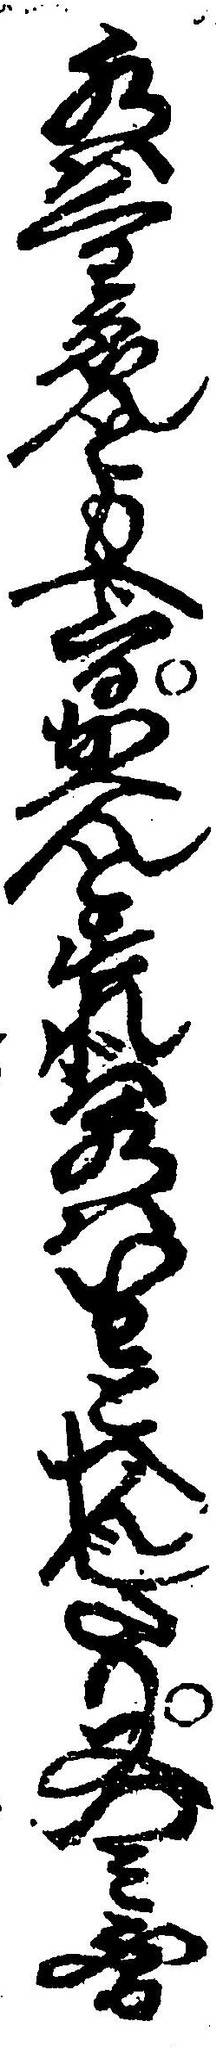みずはくわゑんともへ上る。かへんとすれば水はいわとへんじたり。つみふか
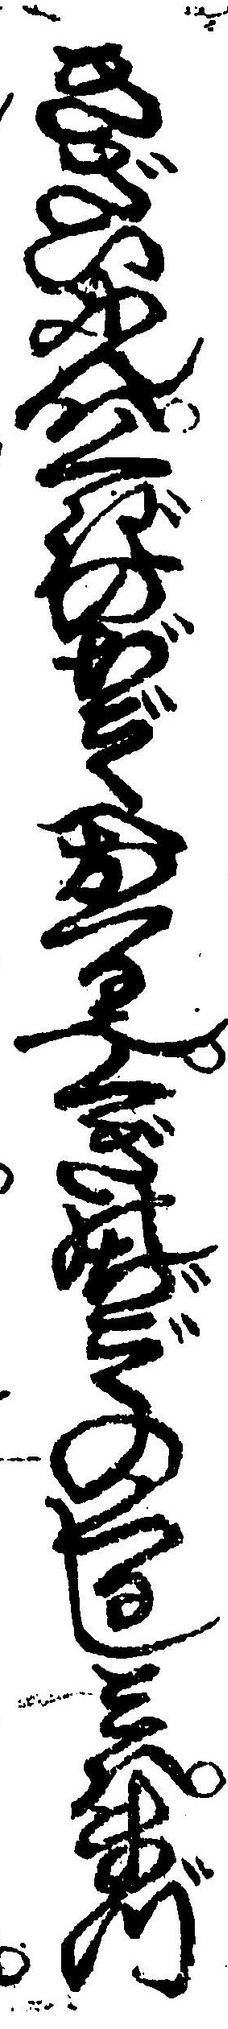きざいにんは。くぎのぢごくへおくる也。くぎのぢごくのくるしみは。まづ
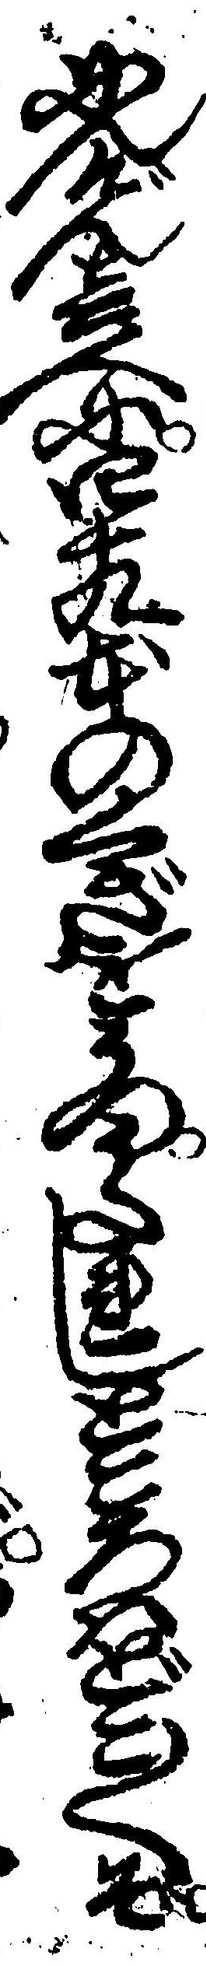にんげんす人に。四十九本のくぎをうつ。うたれしところはどこ〳〵そ。
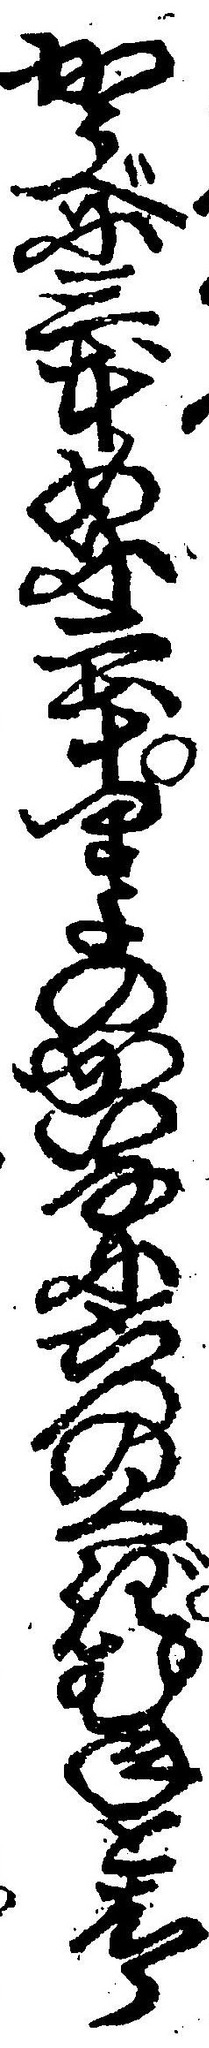かうべに三本めに二本。りよのかいなに六つのくぎ。むねとはら
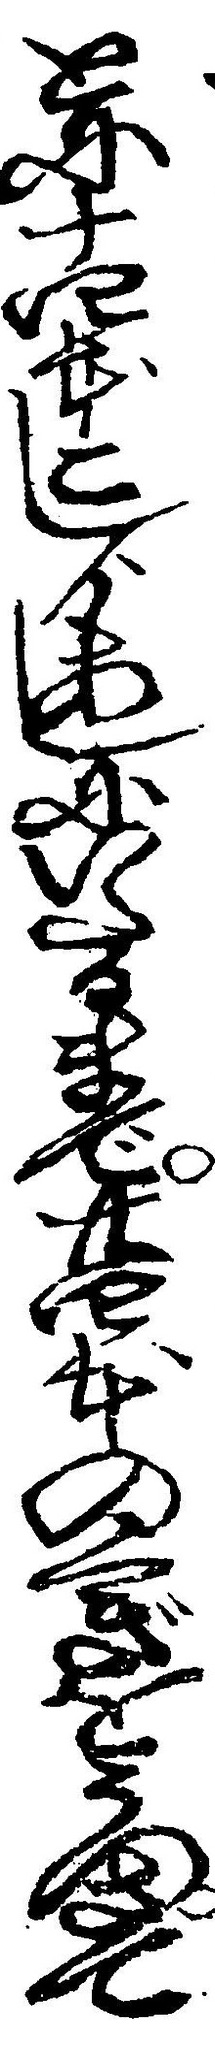とに十四本こしゟあしにいたるまで。廿四本のくぎをうつ。さて
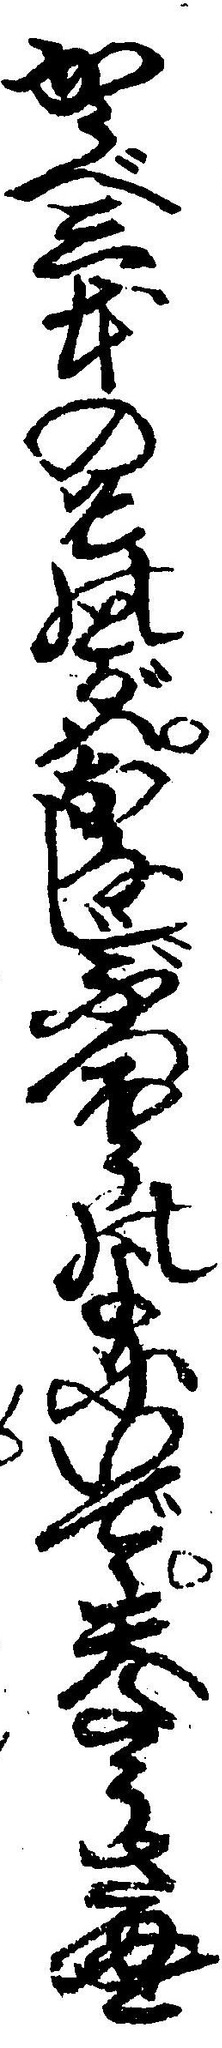かうべ三本のそのとがは。おなじぶつほうのよにいでゝ。天たうさまを
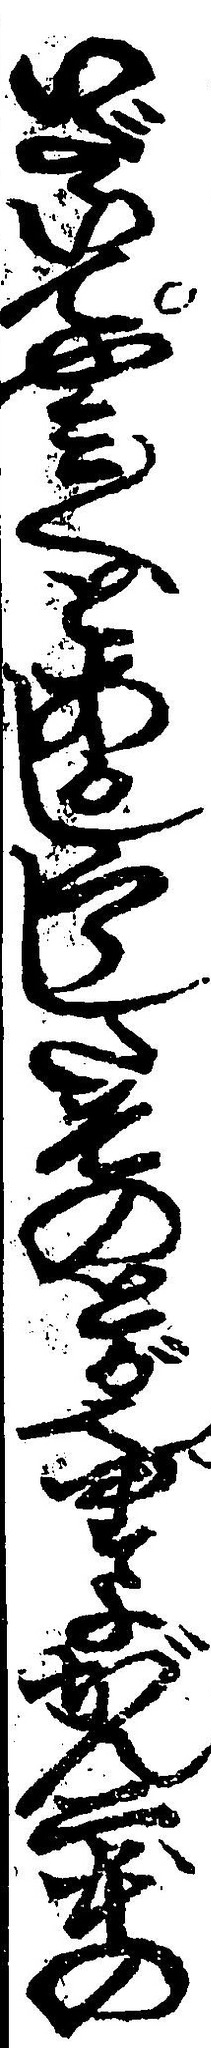いだいて。やみ〳〵とあかしくらしたそのとが也。りよがん日本の
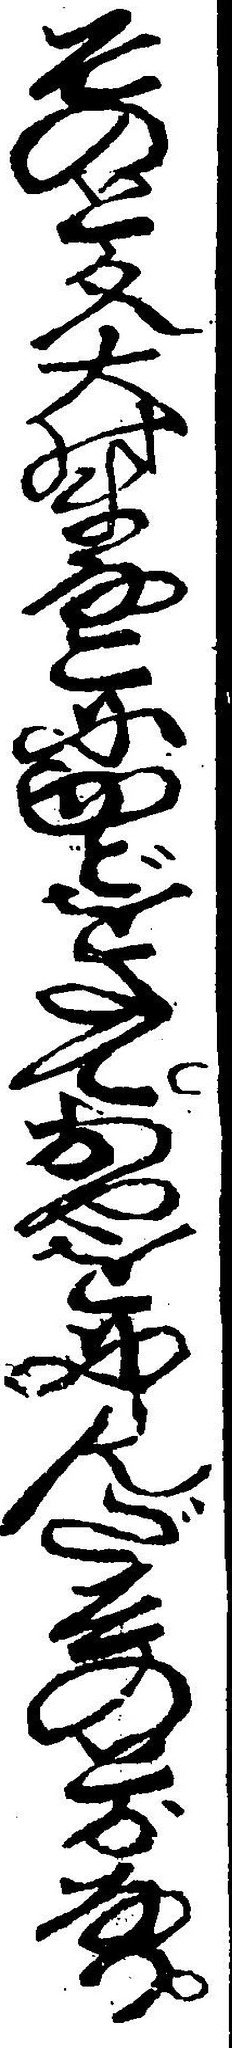そのとかは大のまなこにかどをたて。おやをにらんだそのとがなり。
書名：目連尊者地獄めくり / 宇留藤太夫正本
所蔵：東京大学総合図書館 General Library in the University of Tokyo, JAPAN
